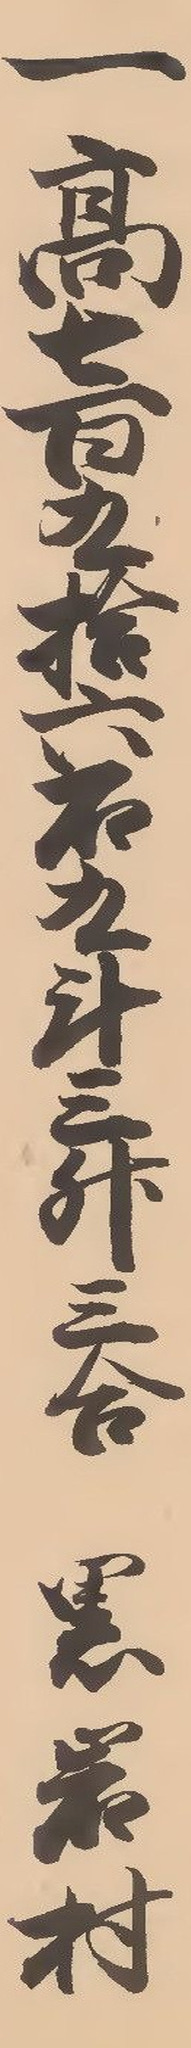一高七百九拾六名九斗三升三合黒岩村
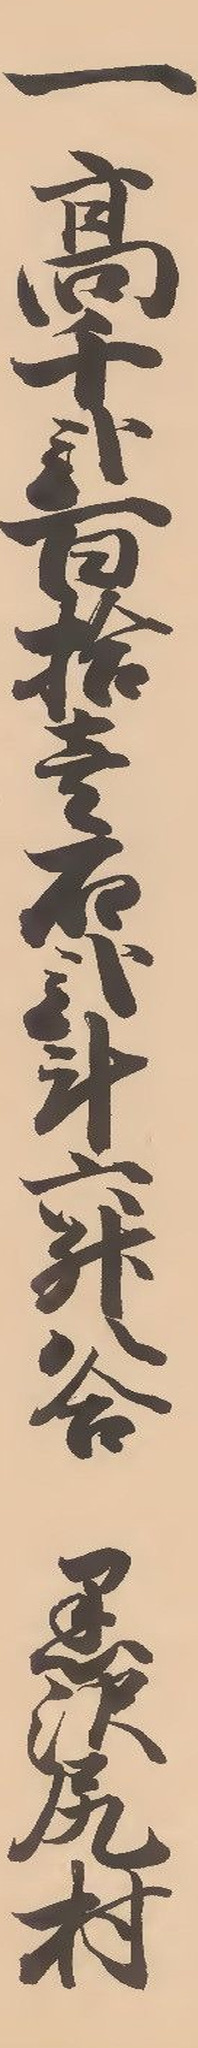一高千弐百拾壱石弐斗六升八合黒沢尻村
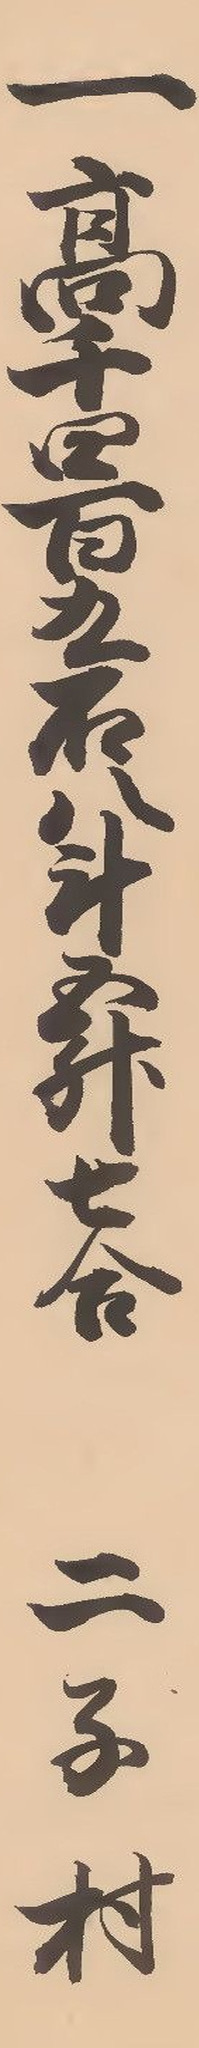一高千四百九石八斗五升七合二子村

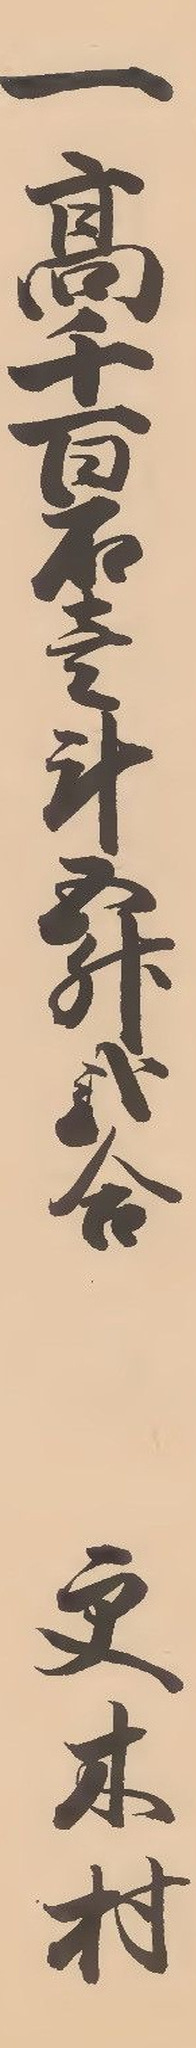一高千百石壱斗五升弐合更木村
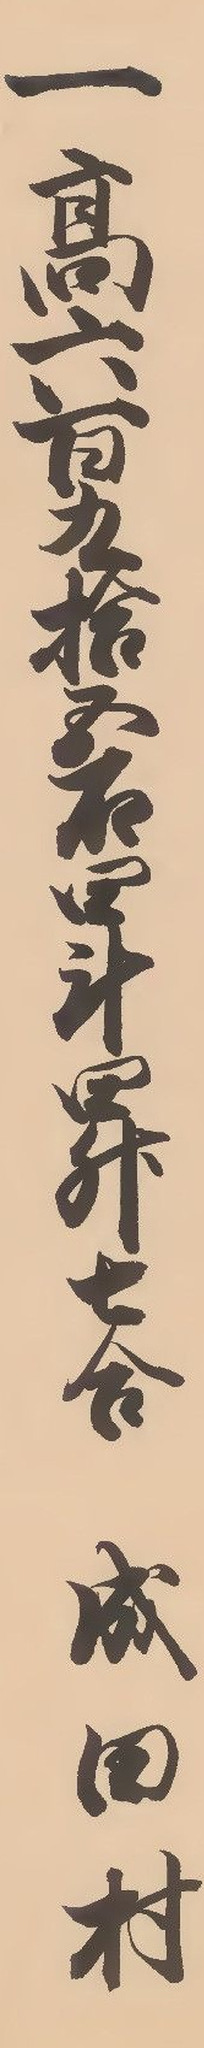一高六百九拾五石四斗四升七合成田村
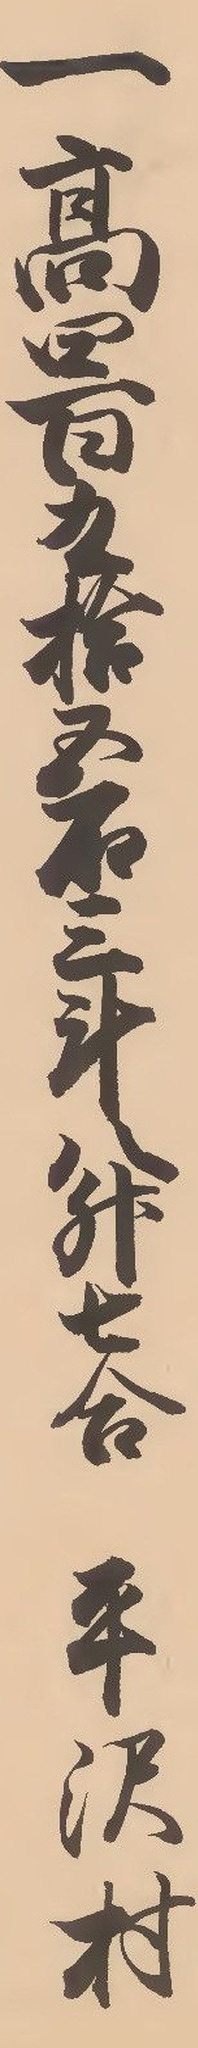一高四百九拾五石三斗八升七合平沢村
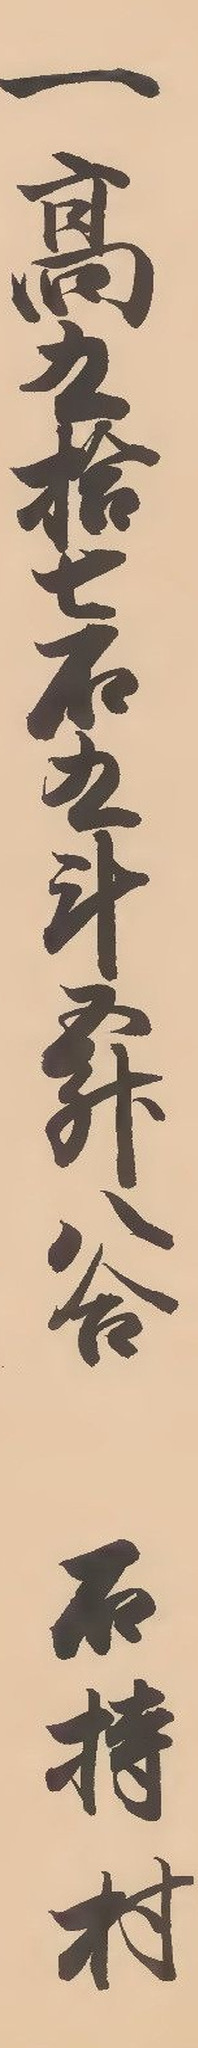一高九拾七石九斗五升八合石持村
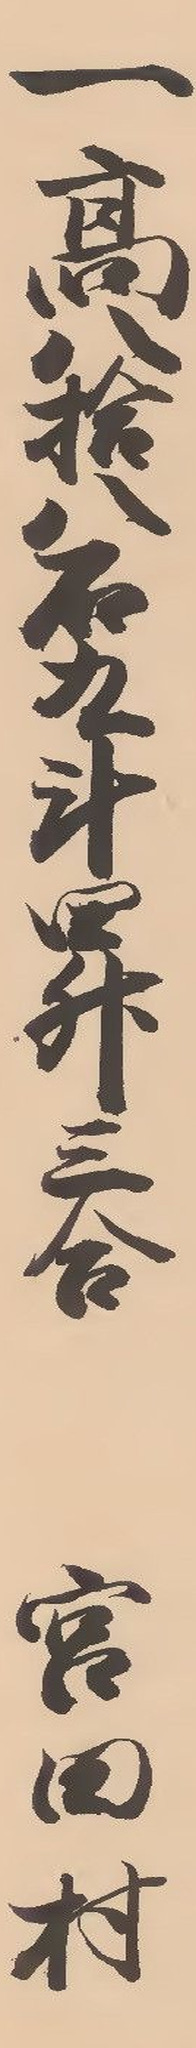一高八拾八石九斗四升三合宮田村
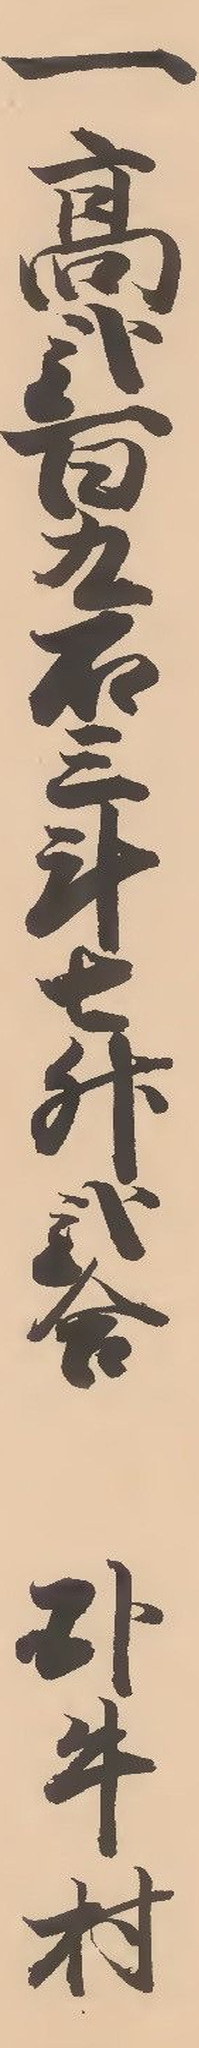一高弐百九石三斗七升弐合臥牛村
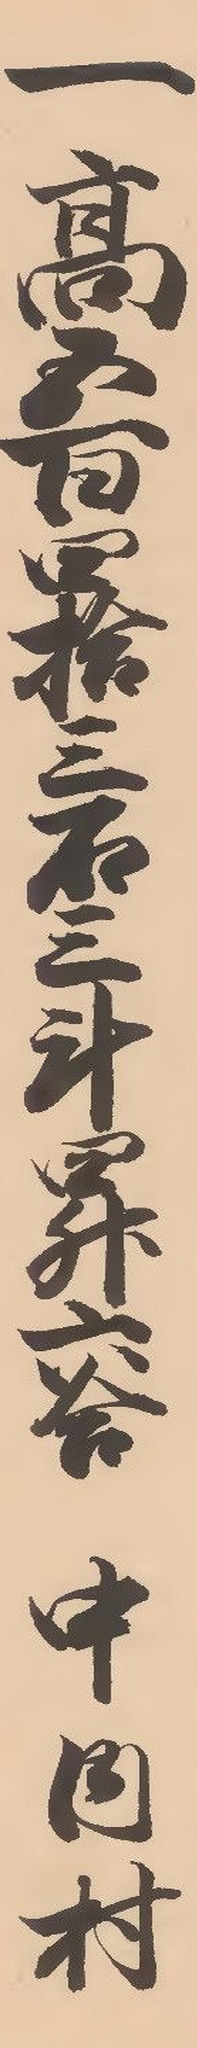一高五百四拾三石三斗四升六合中内村
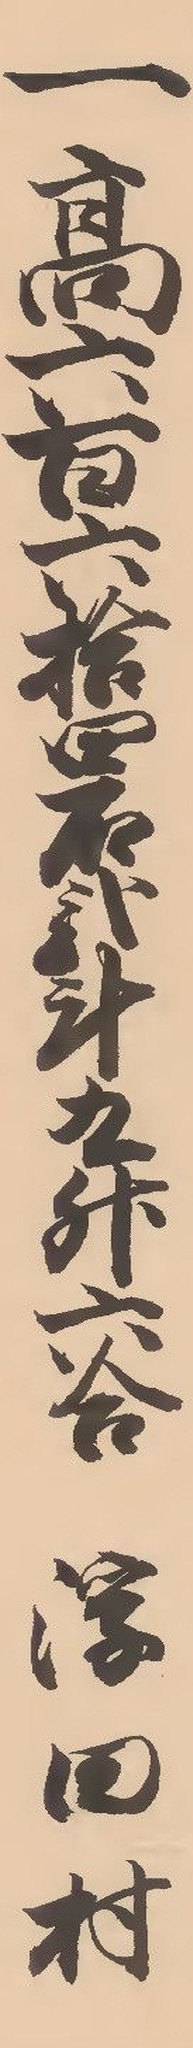一高六百六拾四石弐斗九升六合浮田村

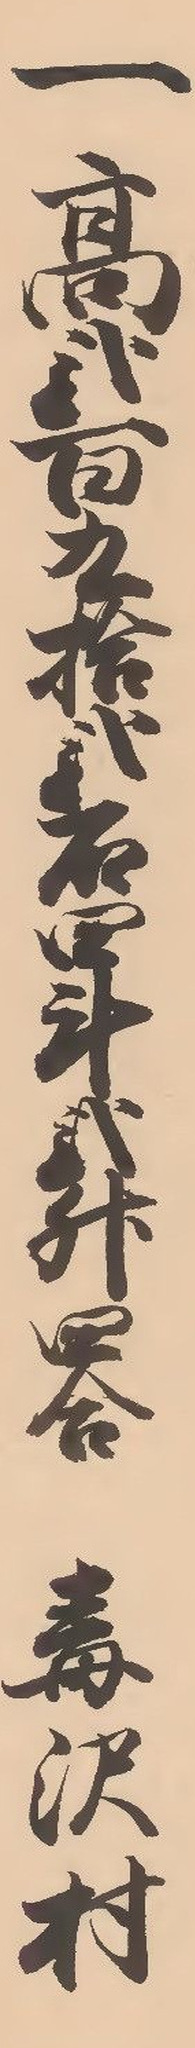一高弐百九拾弐石四斗弐升四合毒沢村
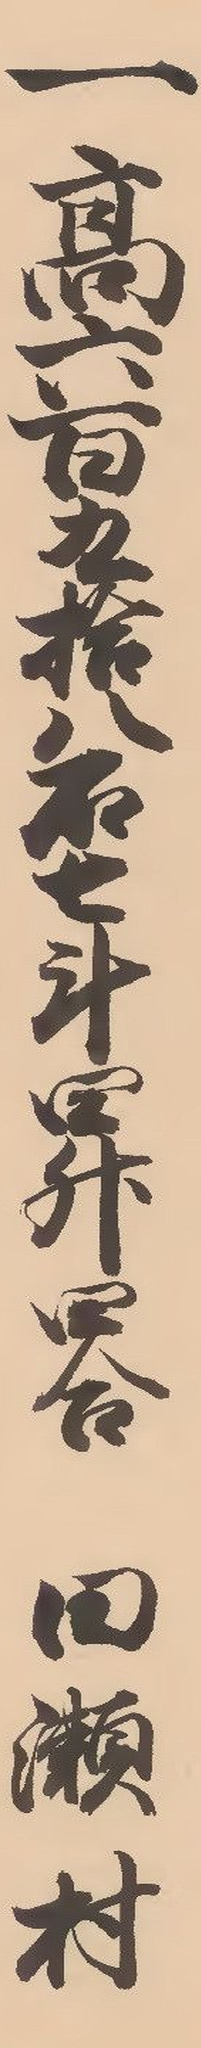一高六百九拾八石七斗四升四合田瀬村
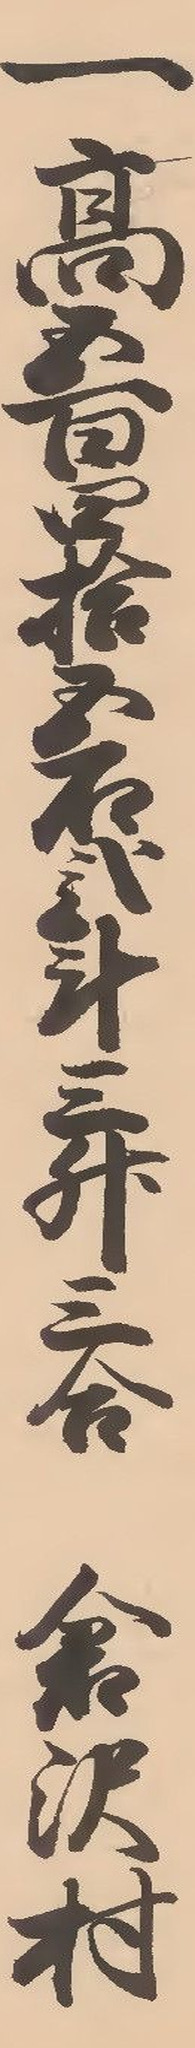一高五百四拾五石弐斗三升三合倉沢村
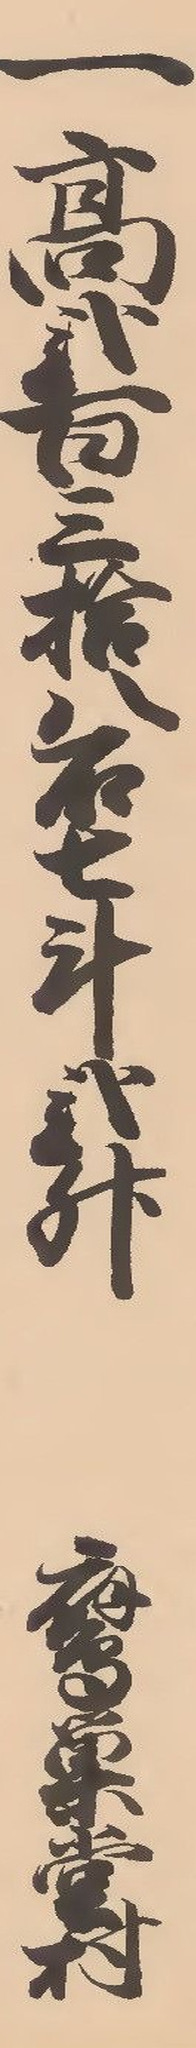一高弐百三拾八石七斗弐升鷹巣堂村
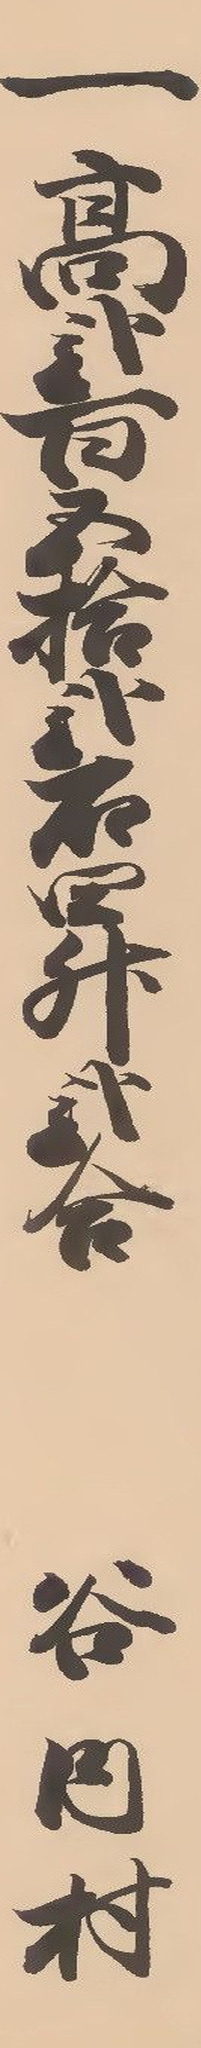一高弐百五拾弐石四升弐合谷内村
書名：陸奥国郷帳　６
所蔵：国立公文書館 National Archives of Japan
